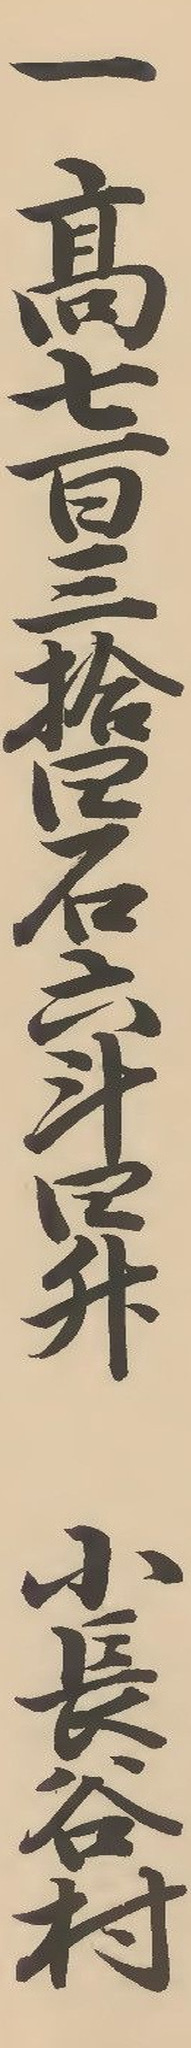一高七百三拾四石六斗四升小長谷村
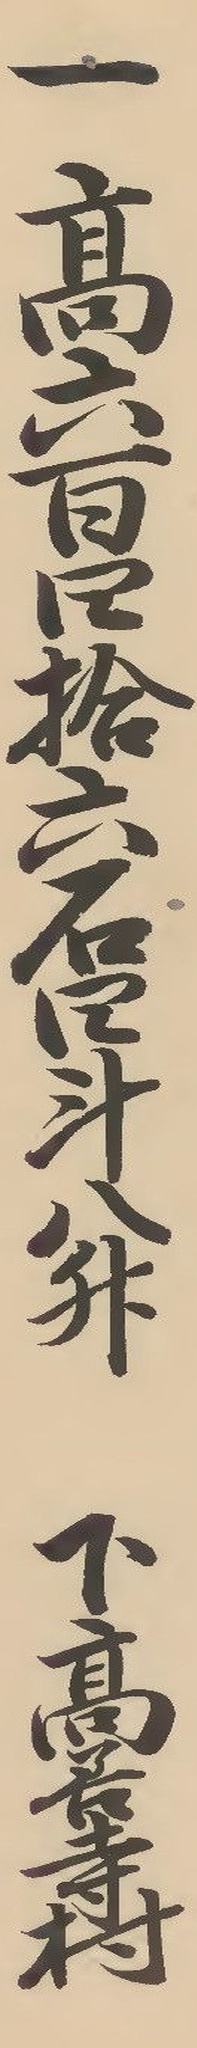一高六百四拾六石四斗八升下高善寺村

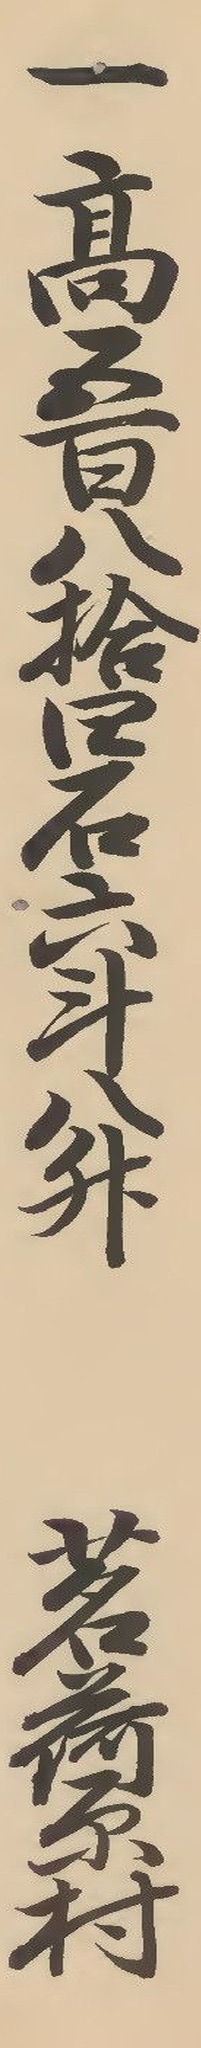一高五百八拾四石六斗八升茗荷原村
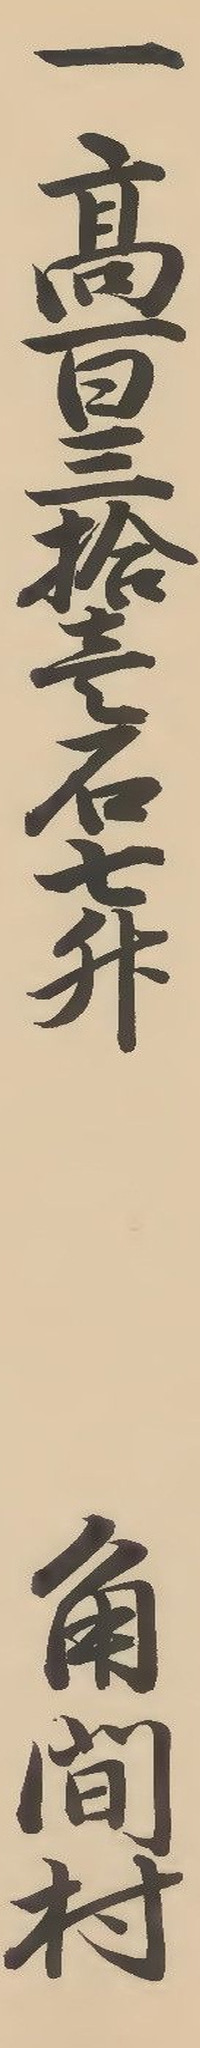一高百三拾壱石七升角間村
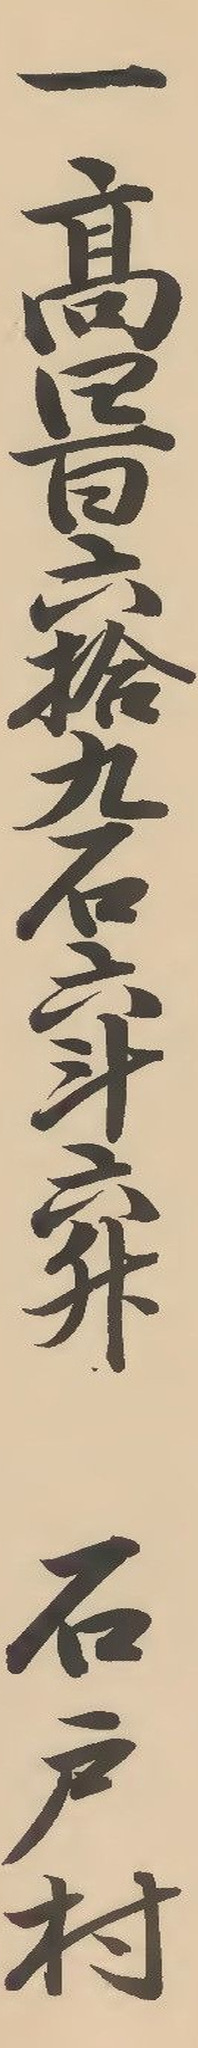一高四百六拾九石六斗六升石戸村
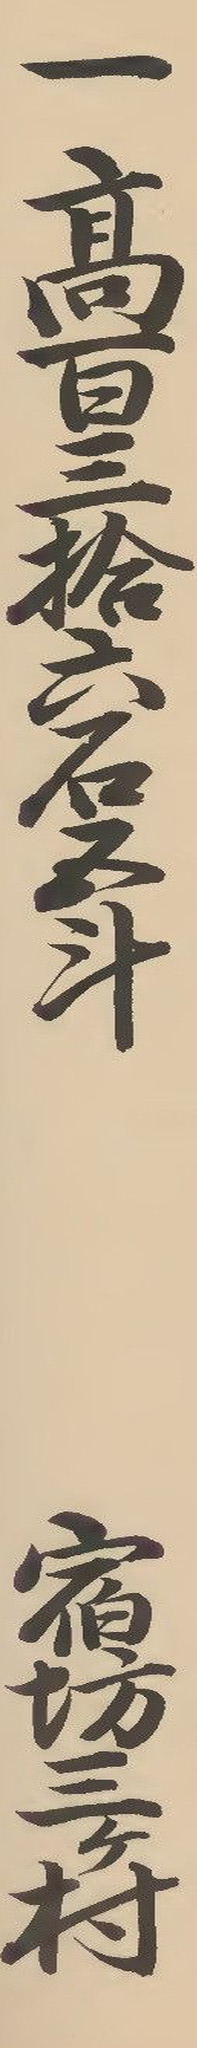一高百三拾六石五斗宿坊三ヶ村
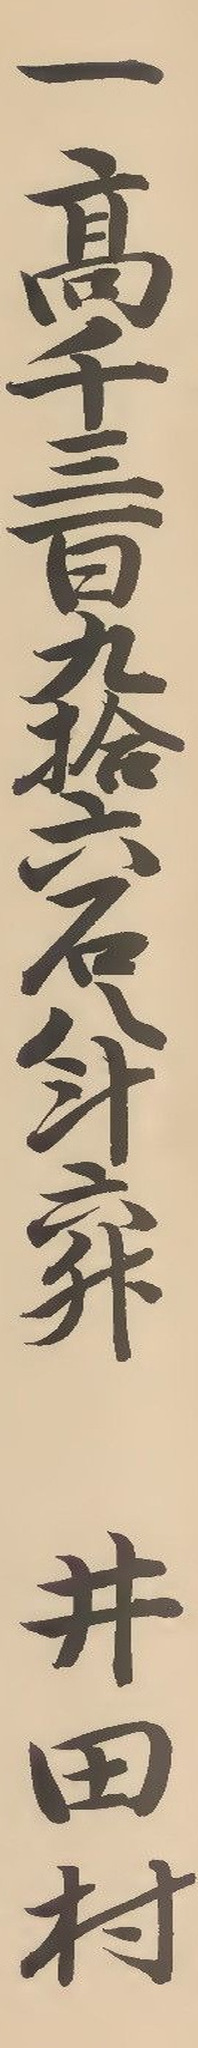一高千三百九拾六石八斗六升井田村
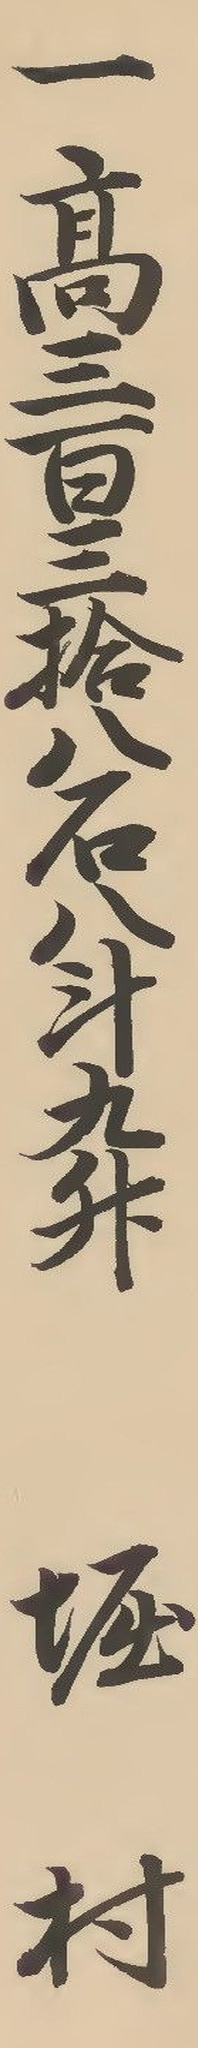一高三百三拾八石八斗九升堀村
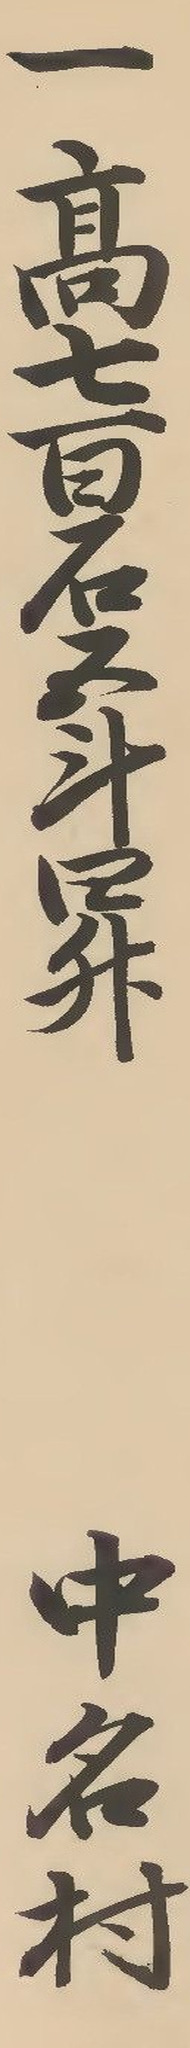一高七百石五斗四升中名村
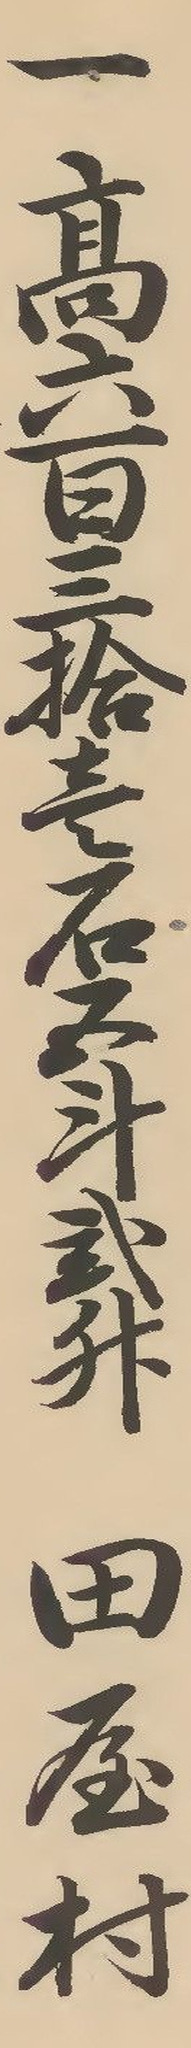一高六百三拾壱石五斗弐升田屋村

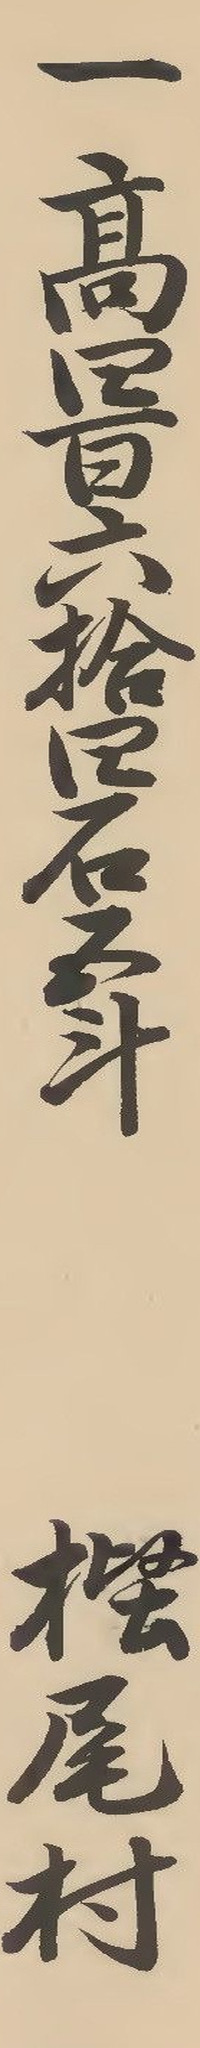一高四百六拾四石五斗樫尾村
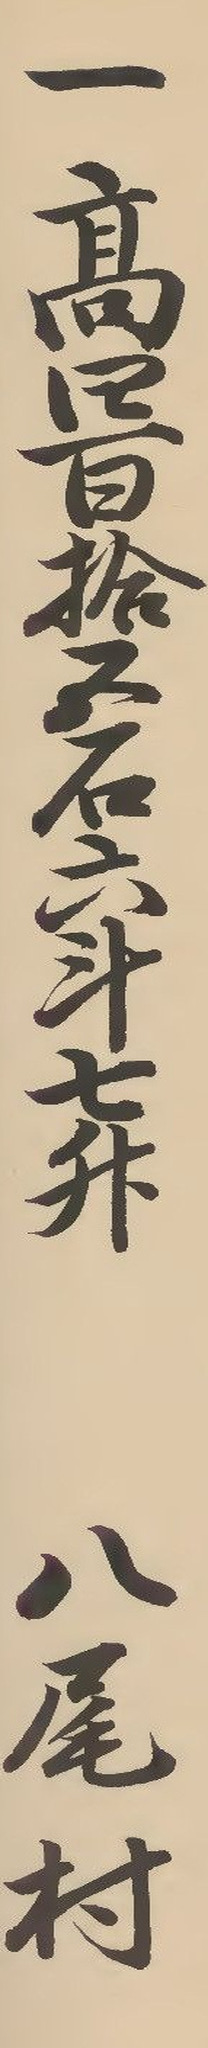一高四百拾五石六斗七升八尾村
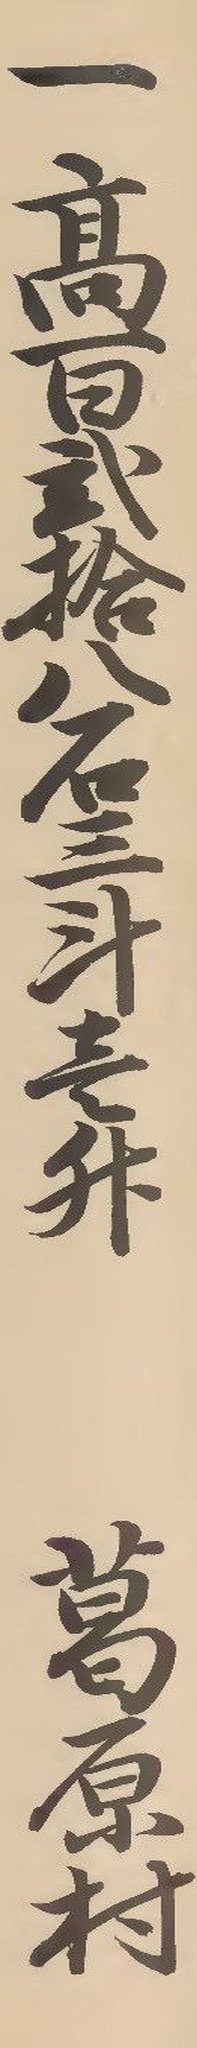一高百弐拾八石三斗壱升葛原村
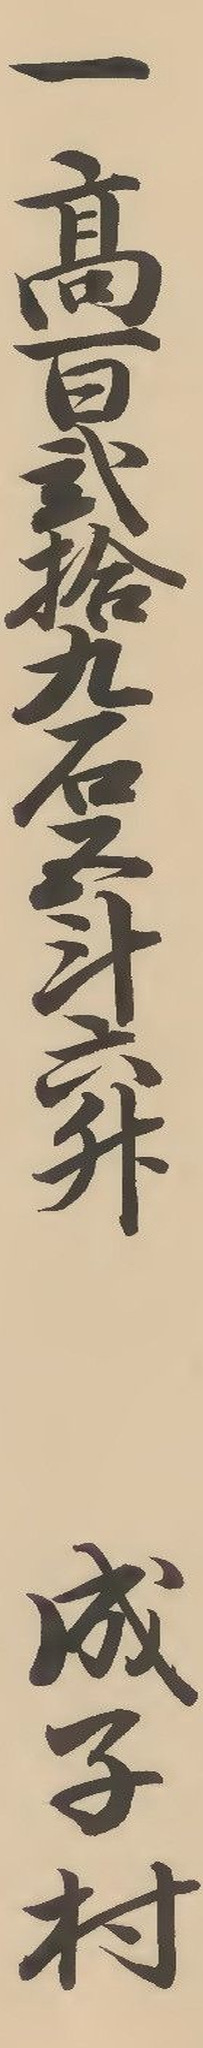一高百弐拾九石五斗六升成子村
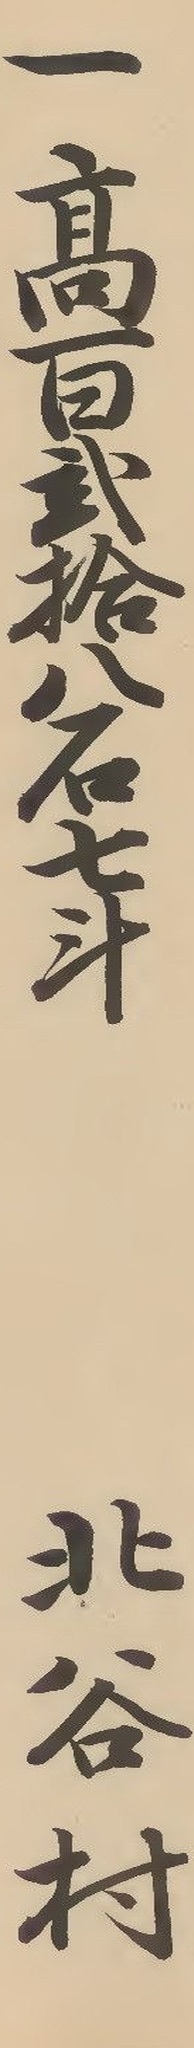一高百弐拾八石七斗北谷村
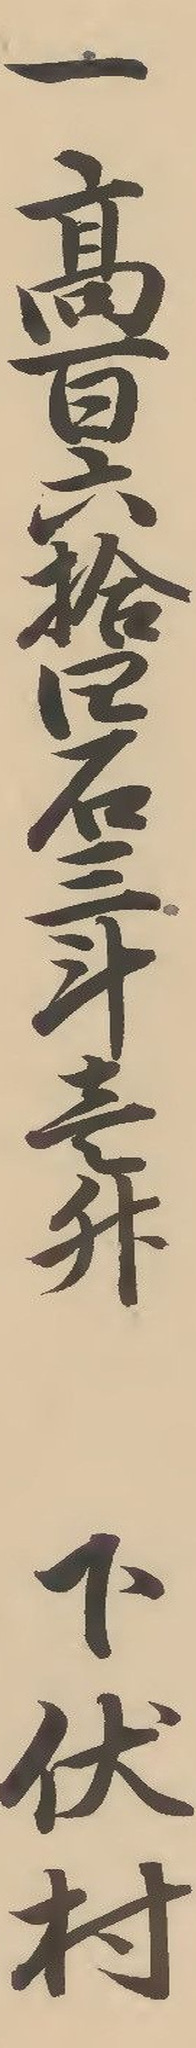一高百六拾四石三斗壱升下伏村
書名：越中国郷帳
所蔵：国立公文書館 National Archives of Japan
